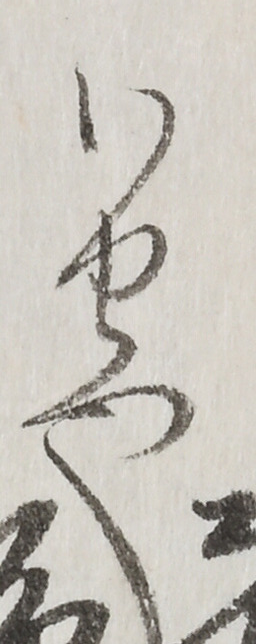いせや
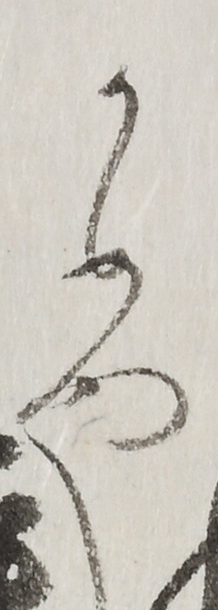かめや
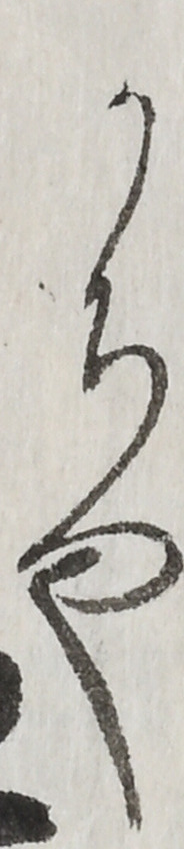かちや

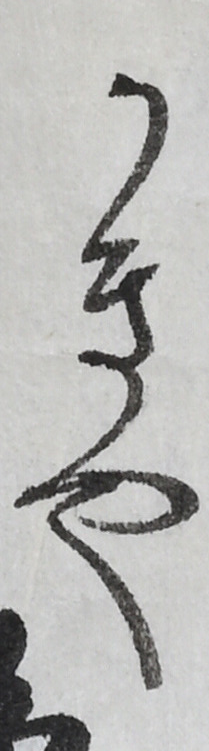かきや
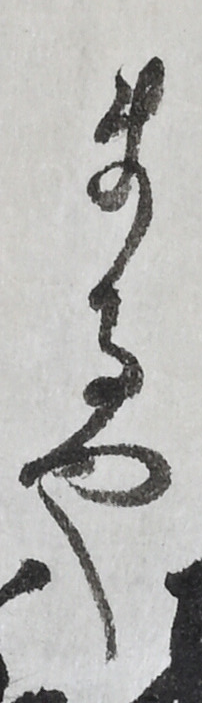まるや
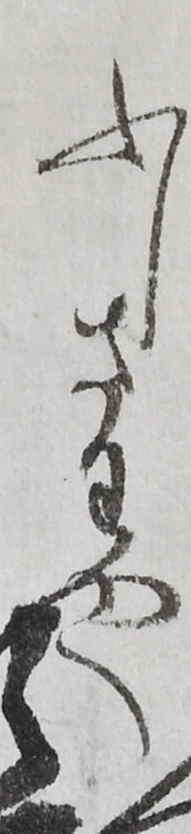にしさわや
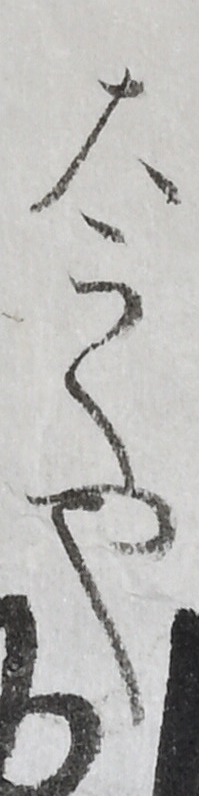大こくや
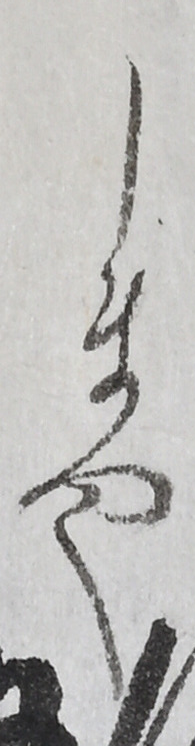しまや
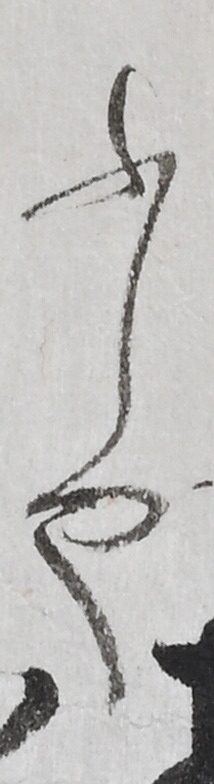ふしや
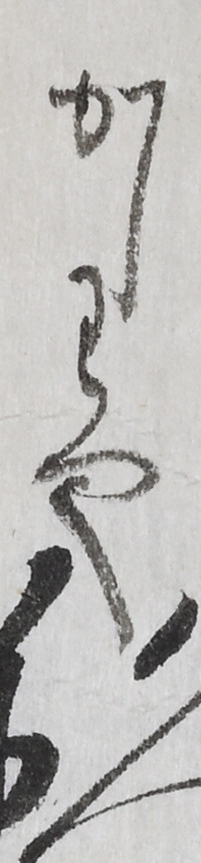かしわや
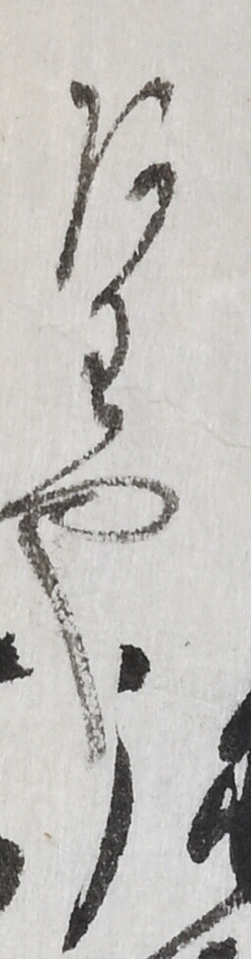あわや
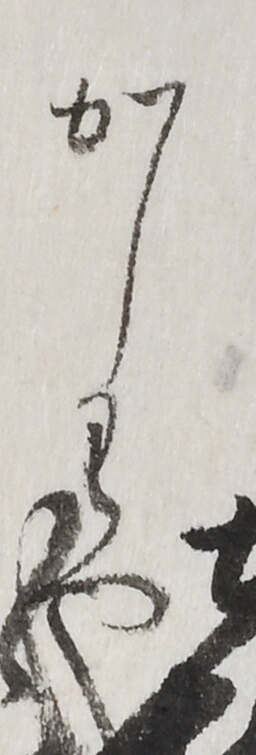かしわや
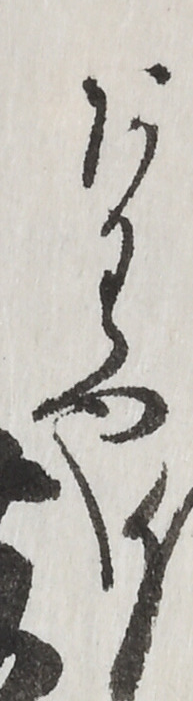あわや
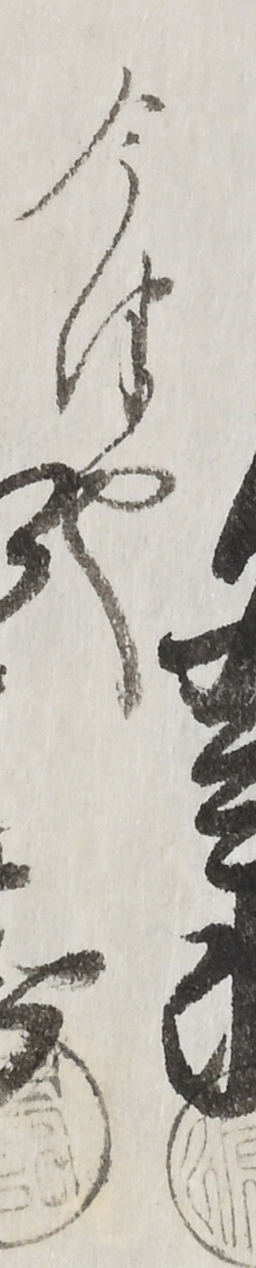今津や
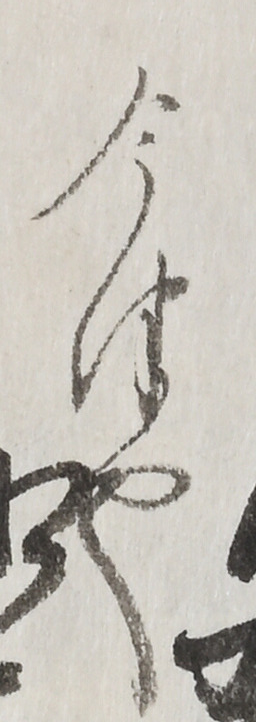今津や
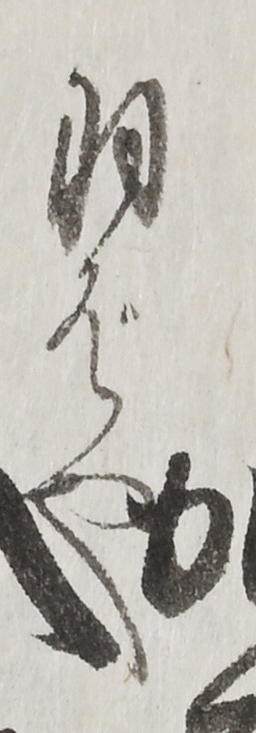羽ばや
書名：當町火消道具幷役付帳
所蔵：伊那市立高遠町図書館・合同会社AMANE
